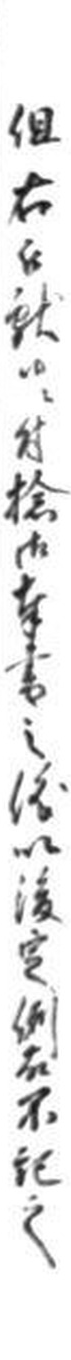但右被献候ニ付捻御奉書之儀以後定例故不記之
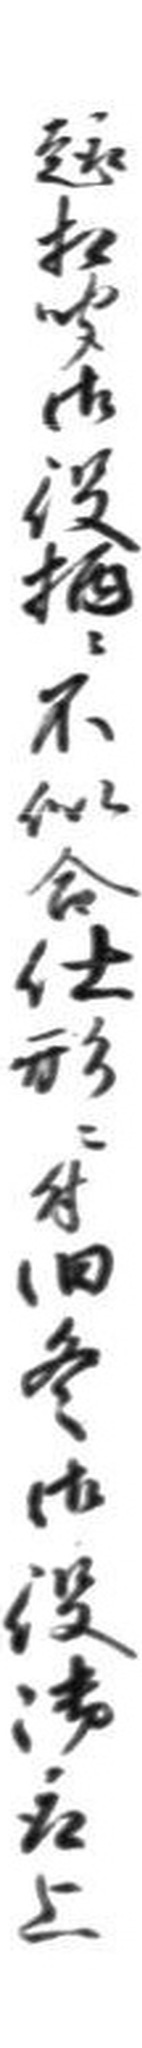趣相聞御役柄ニ不似合仕形ニ付旧冬御役御取上
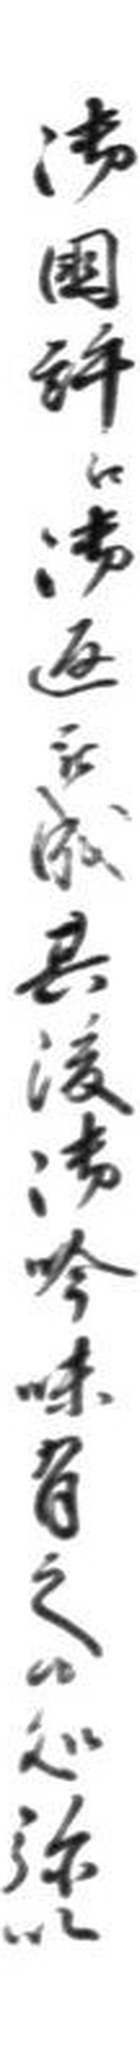御国許江御返被成其後御吟味有之候処弥以
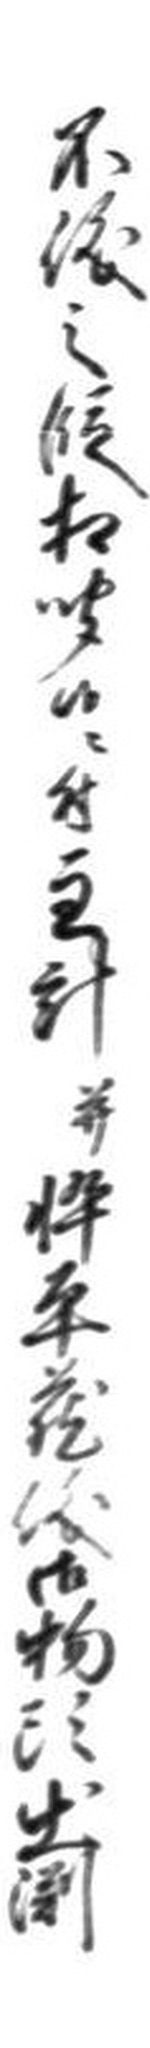不儀之段相聞候ニ付主計幷忰平蔵儀御物頭出渕
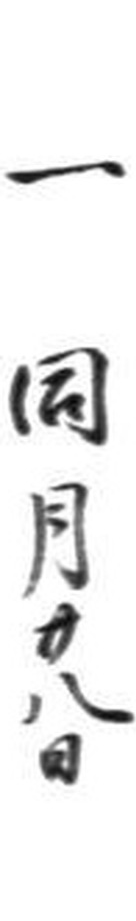一同月廿八日
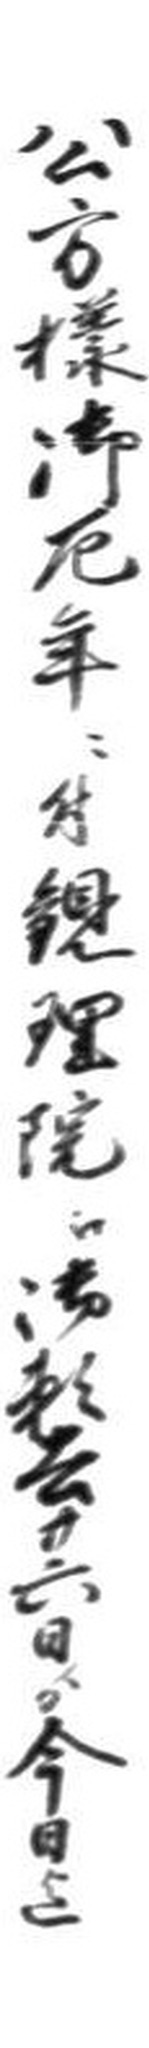公方様御厄年ニ付観理院江御頼去廿六日ゟ今日迄
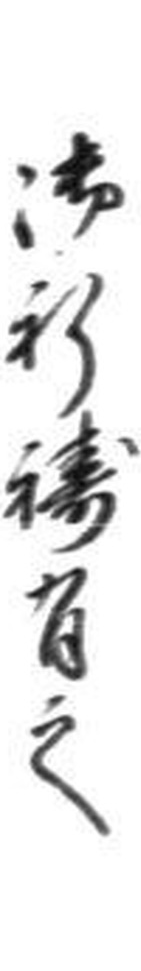御祈禱有之

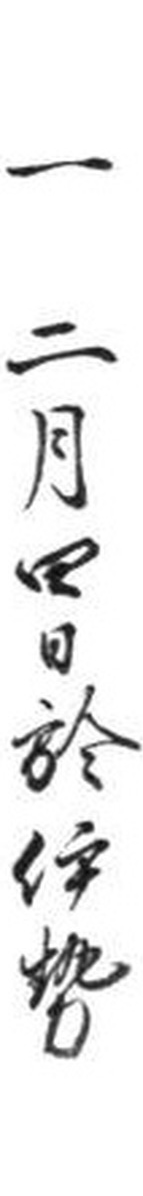一二月四日於伊勢
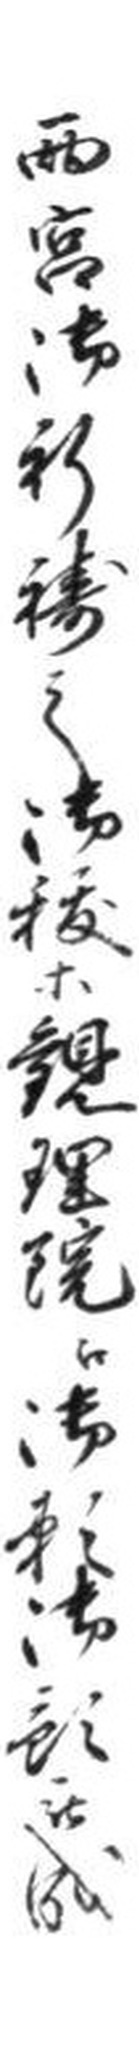西宮御祈禱之御祓等観理院江御頼御預被成
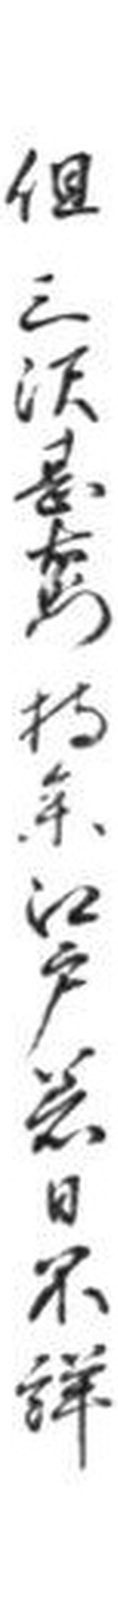但三沢甚右衛門持参江戸着不詳
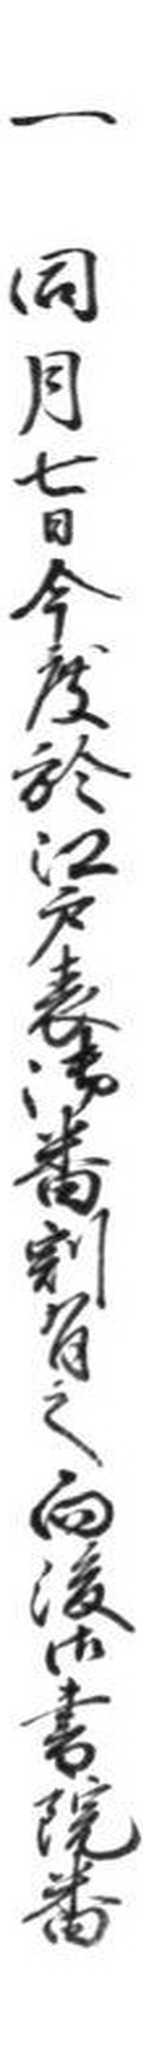一同月七日今度江戸表御番割有之向後御書院番
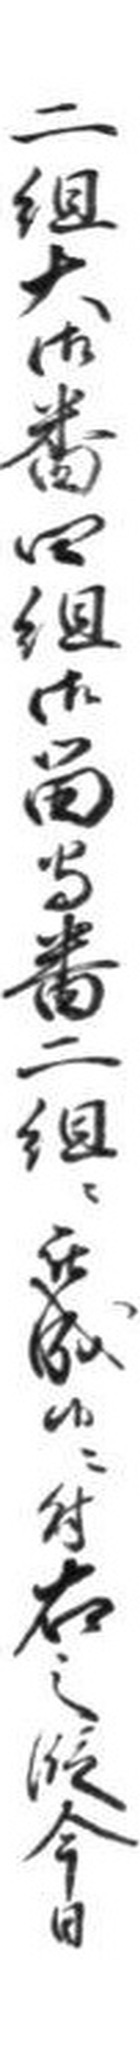二組大御番四組御留守居二組江被成候ニ付右之段今日
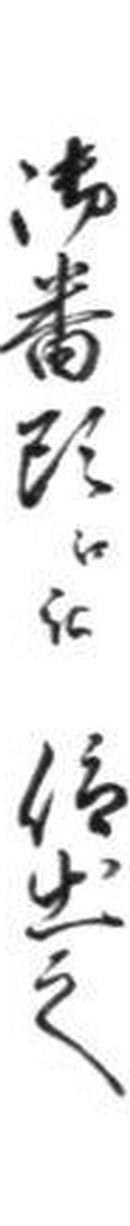御番頭江被仰出之
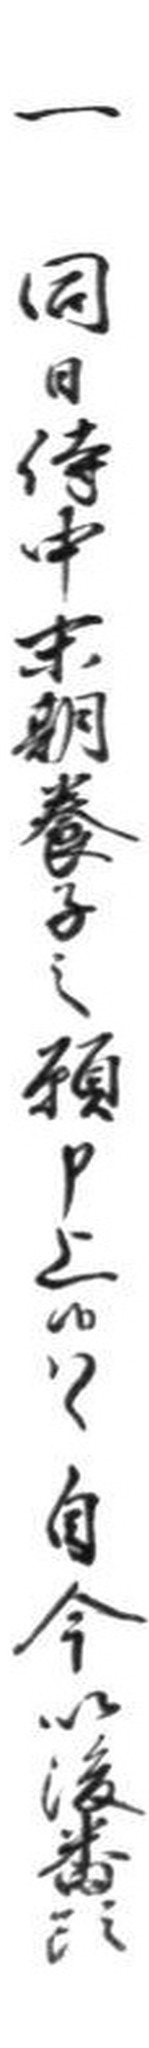一同日侍中末期養子之願申上候ハヽ自今以後番頭
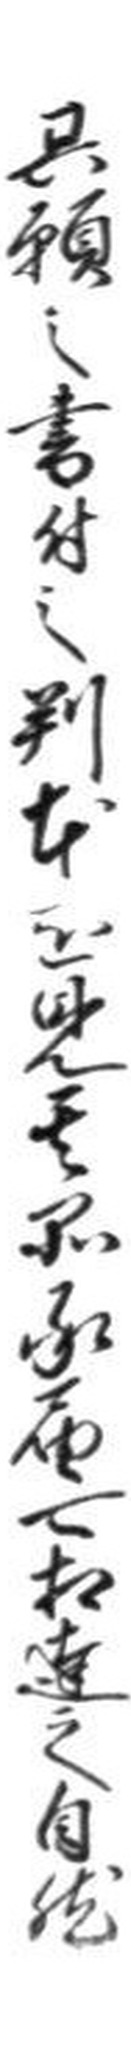其願之書付之判本を見其品承届可相達之自然
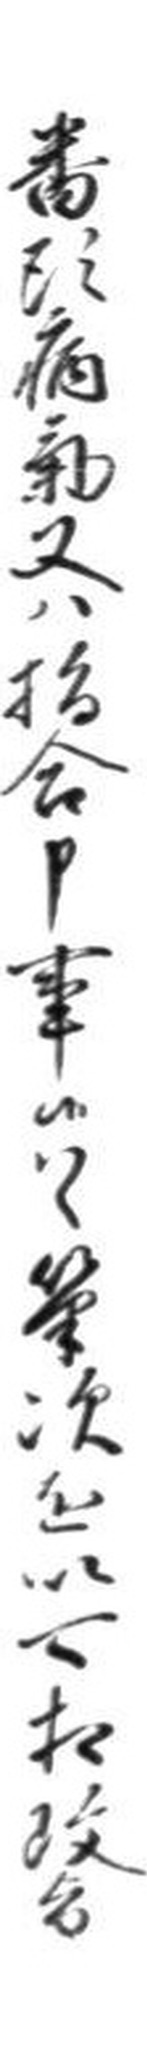番頭病気又ハ指合申事候ハヽ筆次を以可相改旨
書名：家譜 十六 吉品公 従貞享三年閏三月到同四年
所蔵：福井県文書館 Fukui Prefectural Archives
